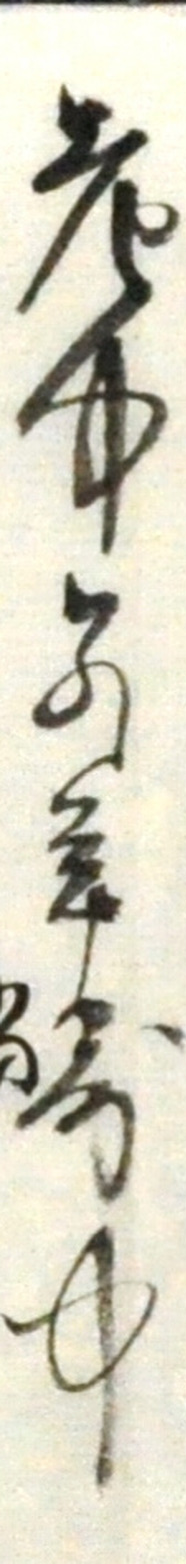老中若年寄中
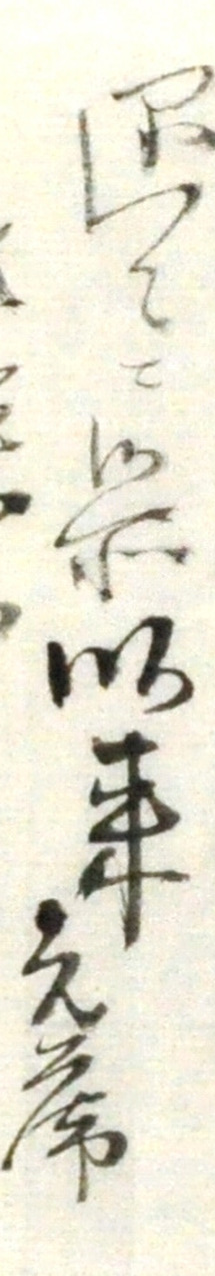区々に候所以来元席
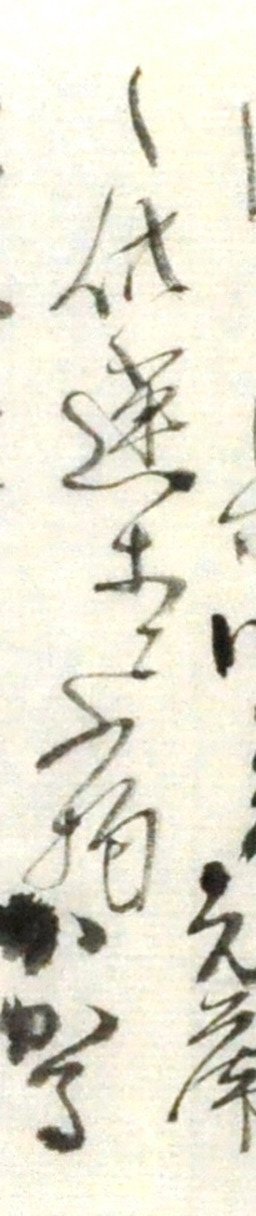之供連等に不拘か駕
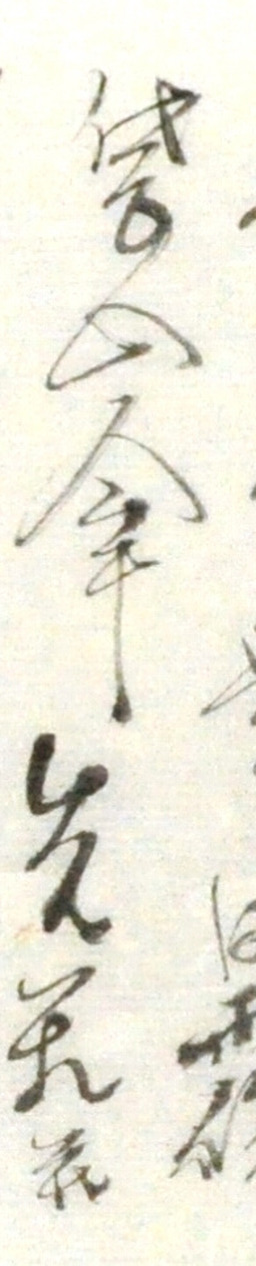袋入傘先箱并
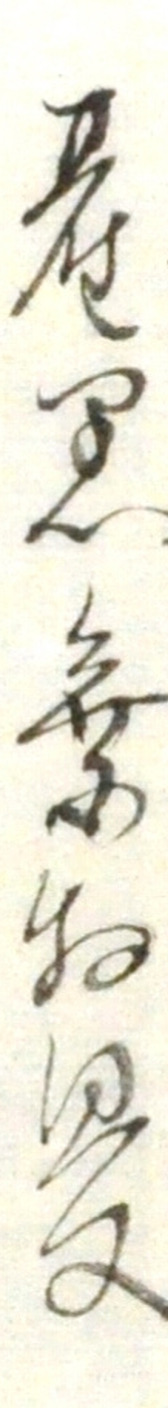蓙懸乗物且又
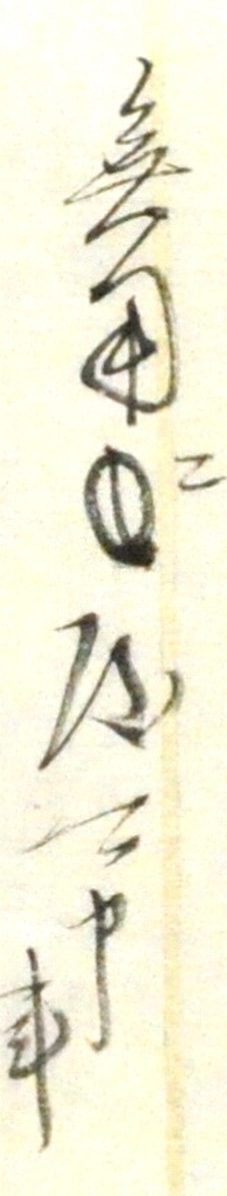無用に致可申事

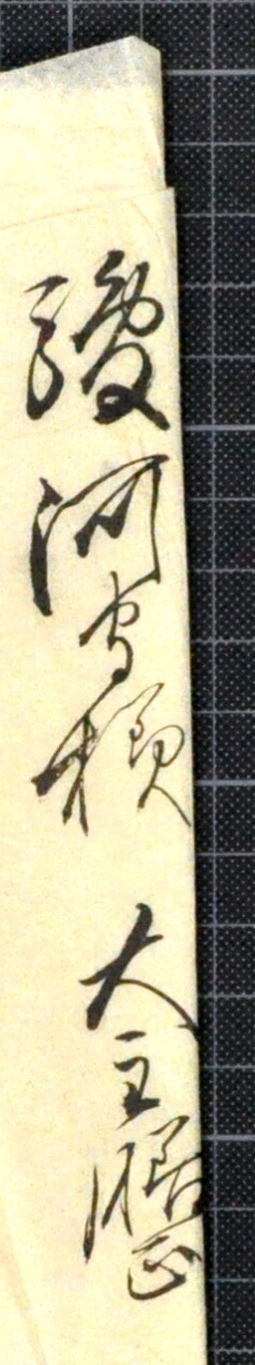駿河守様大主膳正

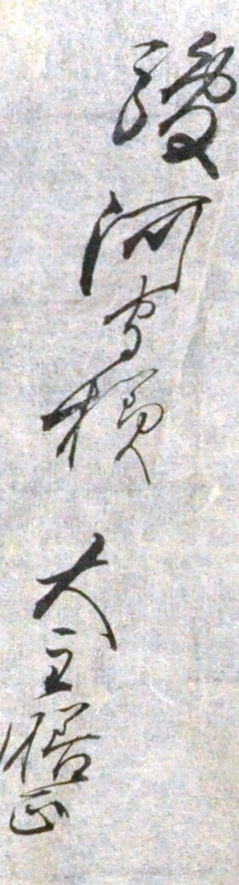駿河守様大主膳正

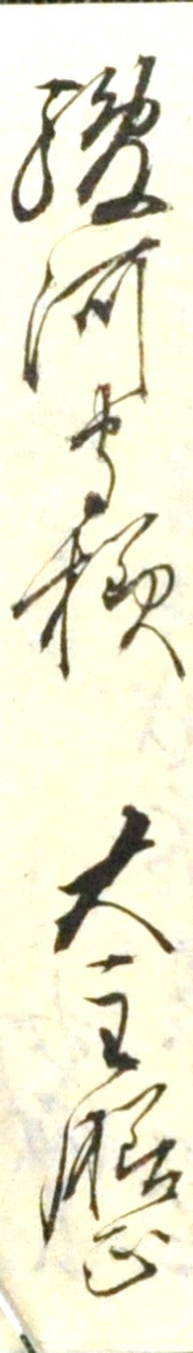駿河守様大主膳正

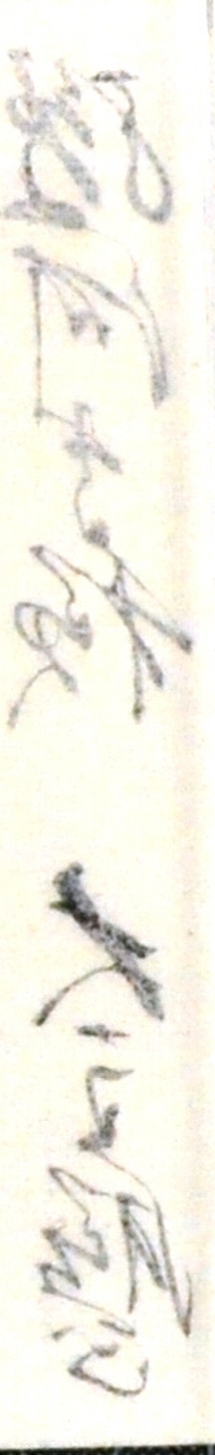六月十三日
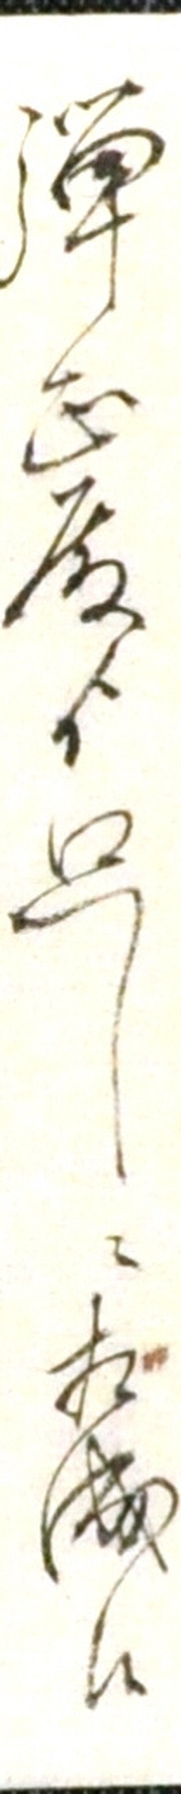弾正殿ゟ廻しに相成候
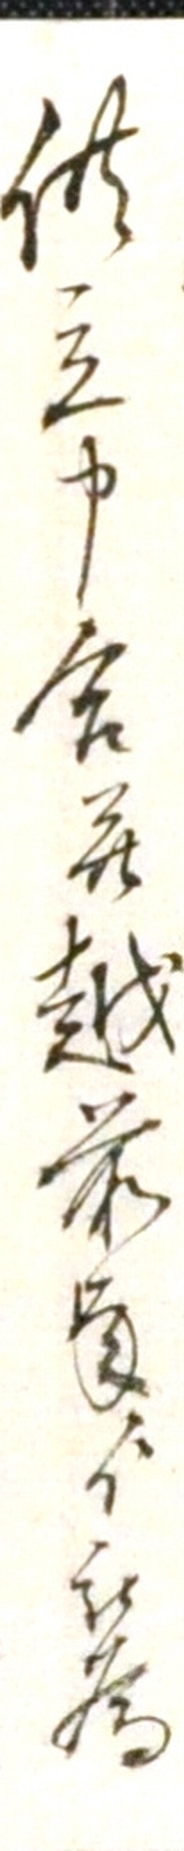供立申合并越前殿ゟ被為
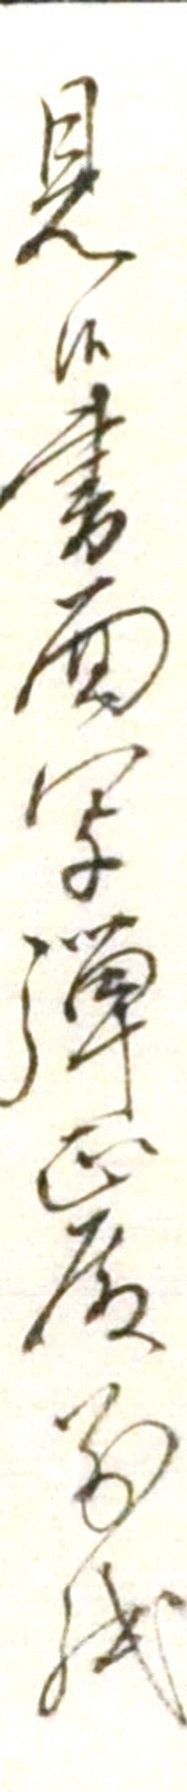見候書面写弾正殿別紙
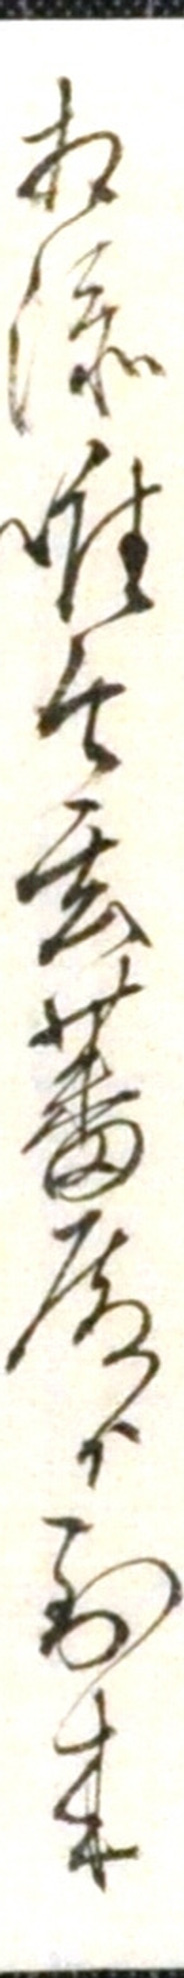相添唯今玄蕃殿ゟ到来
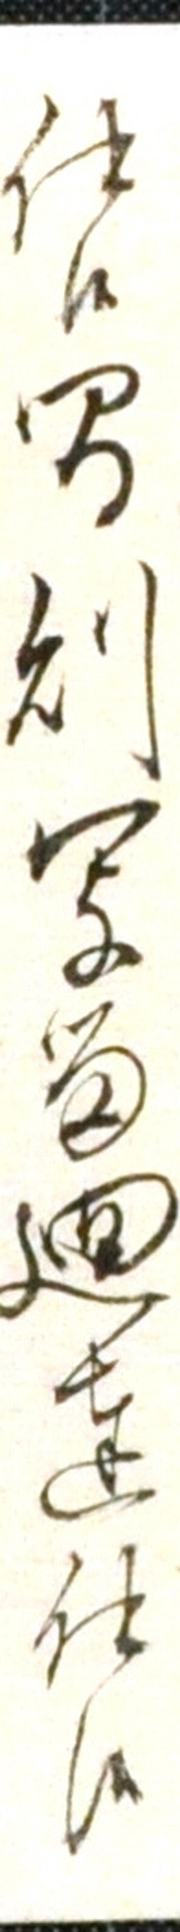仕候間則写留廻達仕候
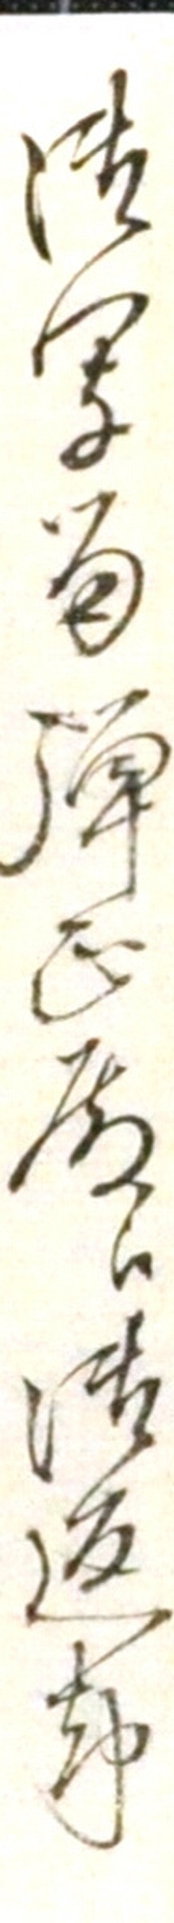御写留弾正殿え御返却
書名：申合書付
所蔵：伊那市立高遠町図書館・合同会社AMANE
